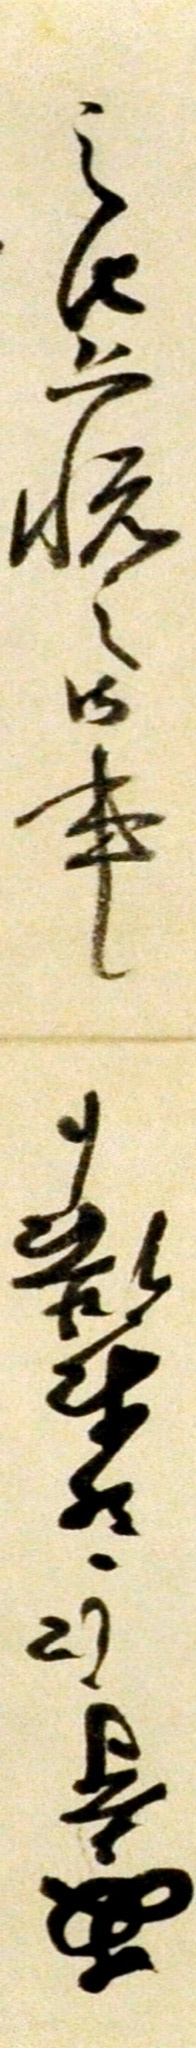之由恐悦之御事候
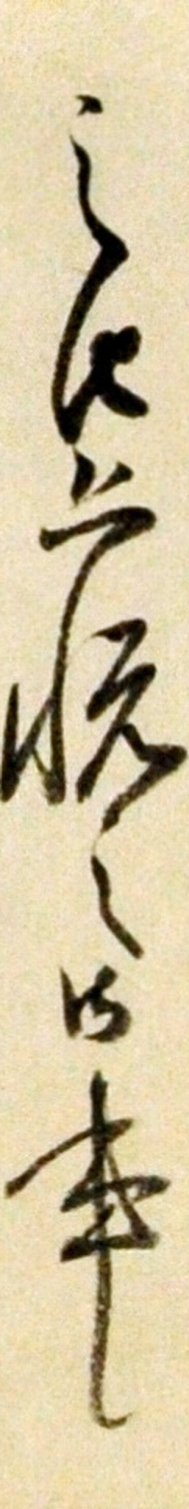之由恐悦之御事候
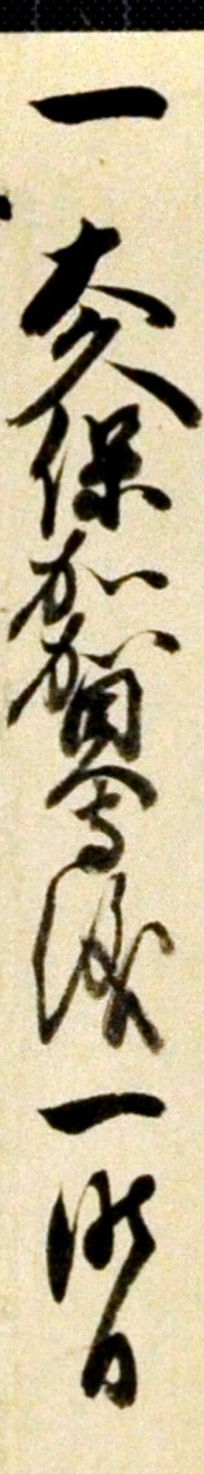一大久保加賀守儀一昨日
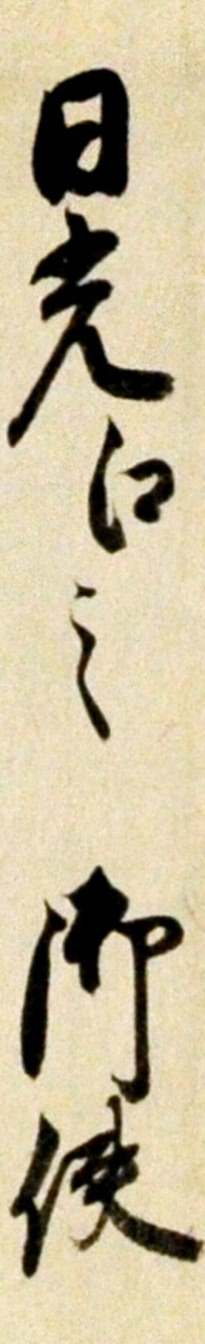日光江之御使
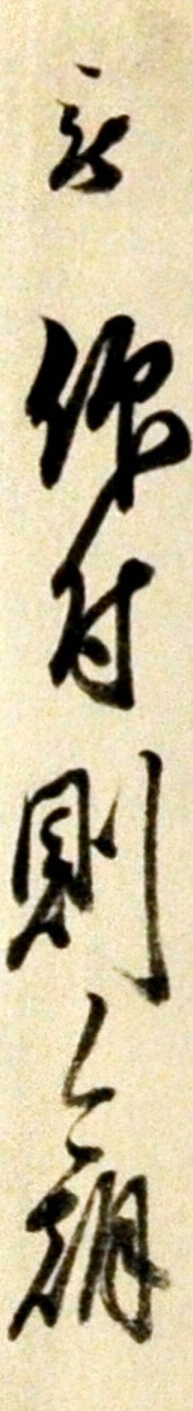被仰付則今朝
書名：書状
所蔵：伊那市立高遠町図書館・合同会社AMANE
